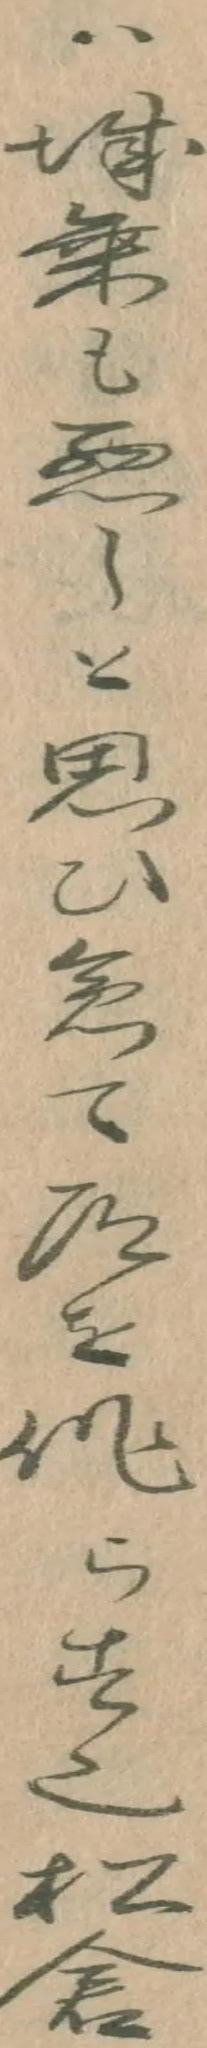は城乗茂悪しと思ひ急て道を作ら春也松倉
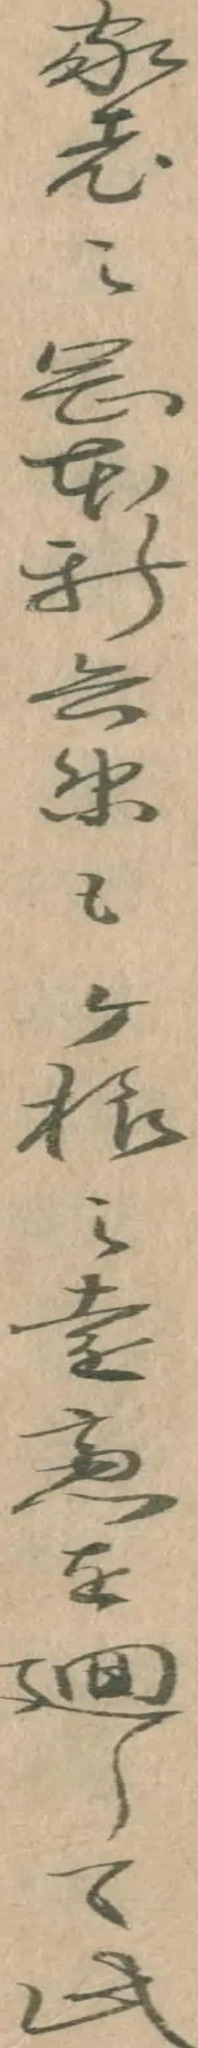家老之岡本新兵衛もけ様之遠慮を廻して此
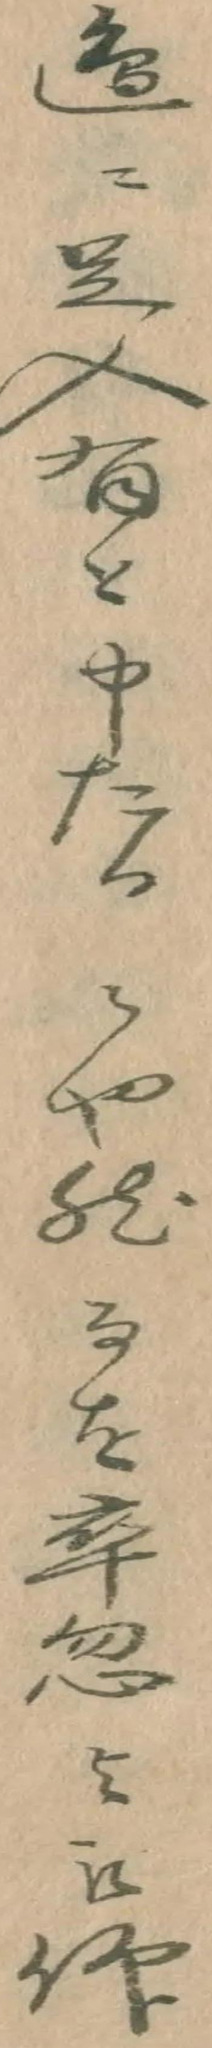辺に足入有と申たるにや然るを卒忽与被仰

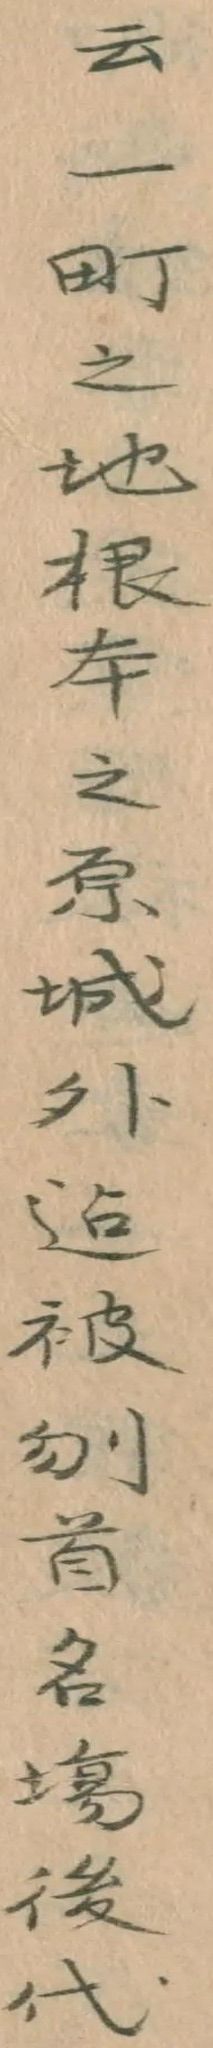云一町之地根夲之原城外迄被刎首名場後代
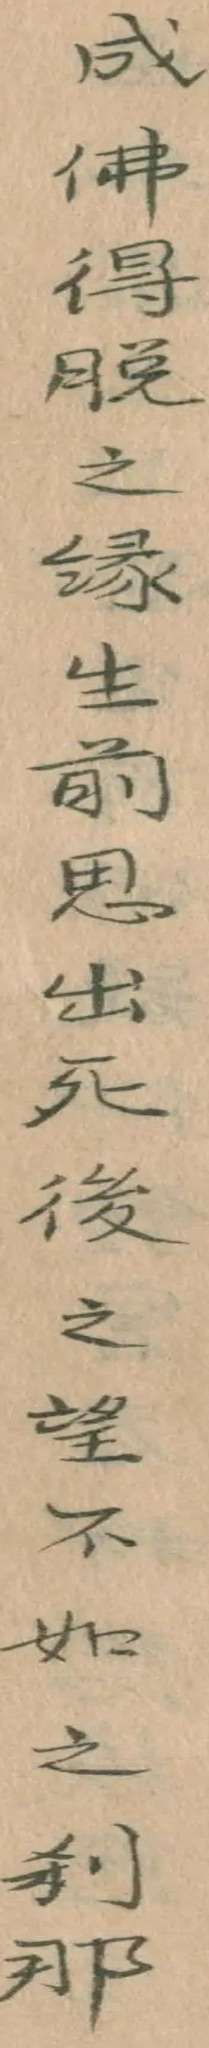成仏得脱之縁生前思出死後之望不如之刹那
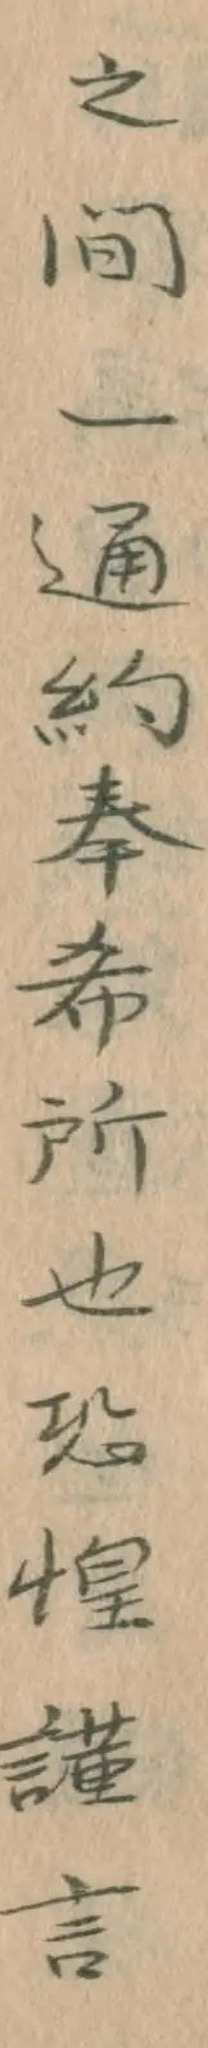之間一通約奉希所也恐惶謹言
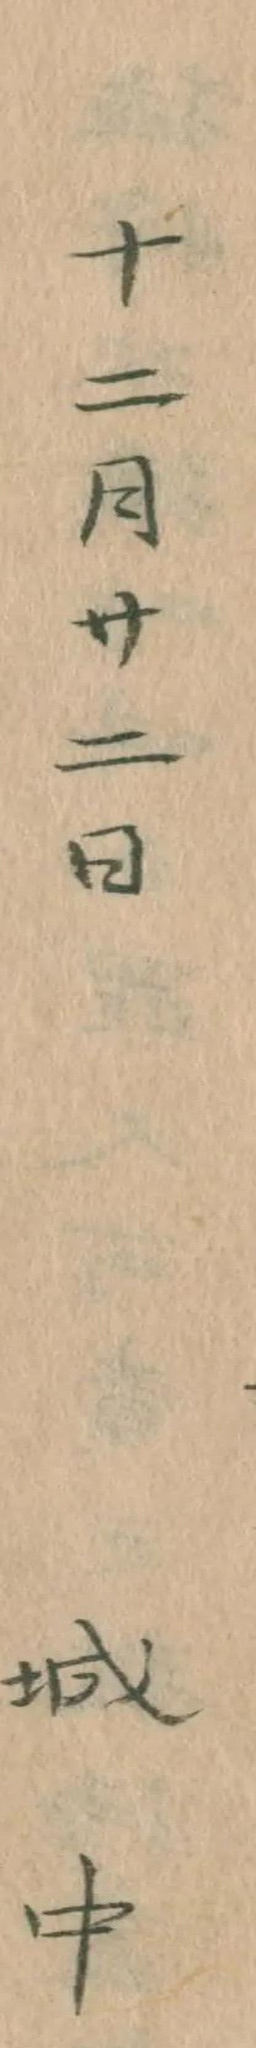十二月廿二日城中
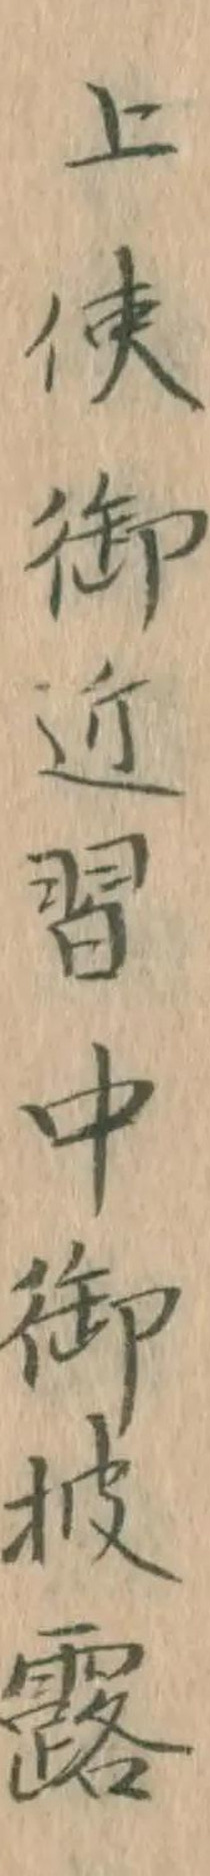上使御近習中御披露
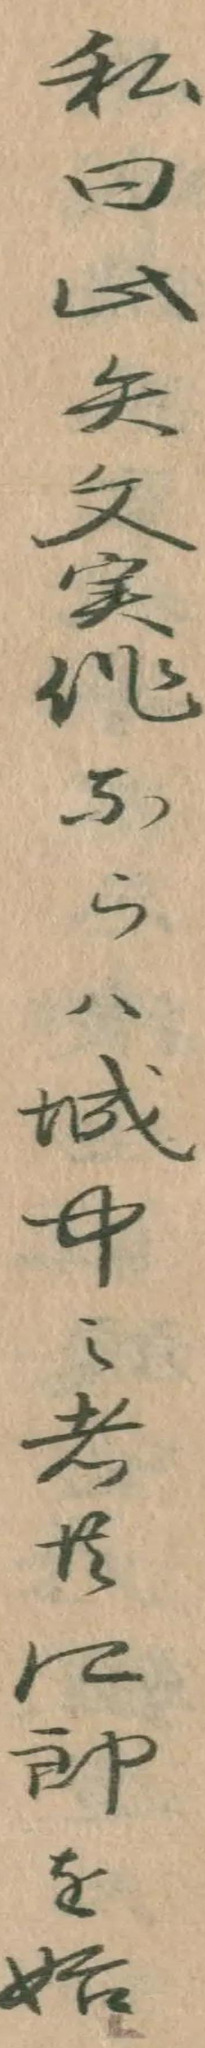私曰此矢文実作ならは城中之者共四郎を始
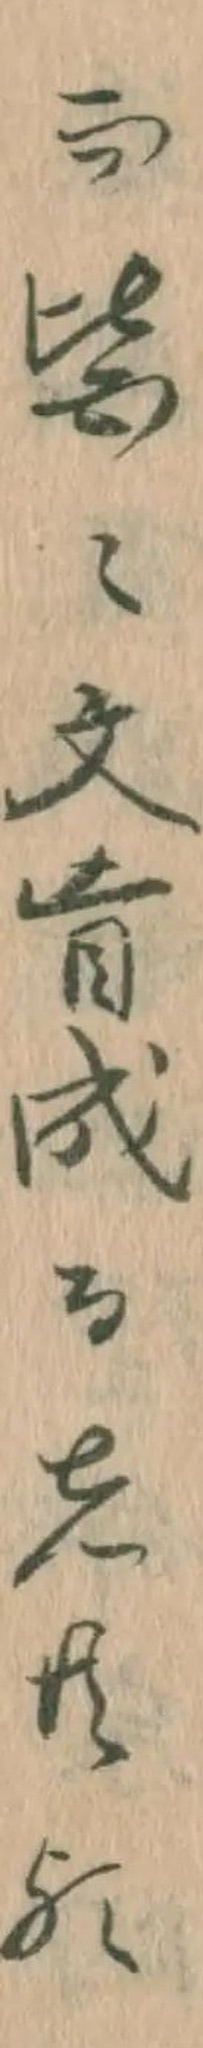而皆々文旨成る者共歟
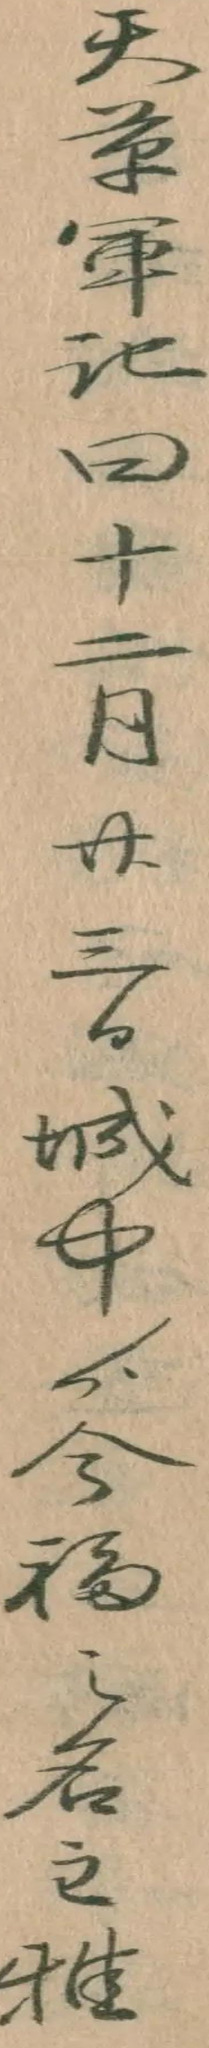天草軍記曰十二月廿三日城中ゟ今福之名主雅
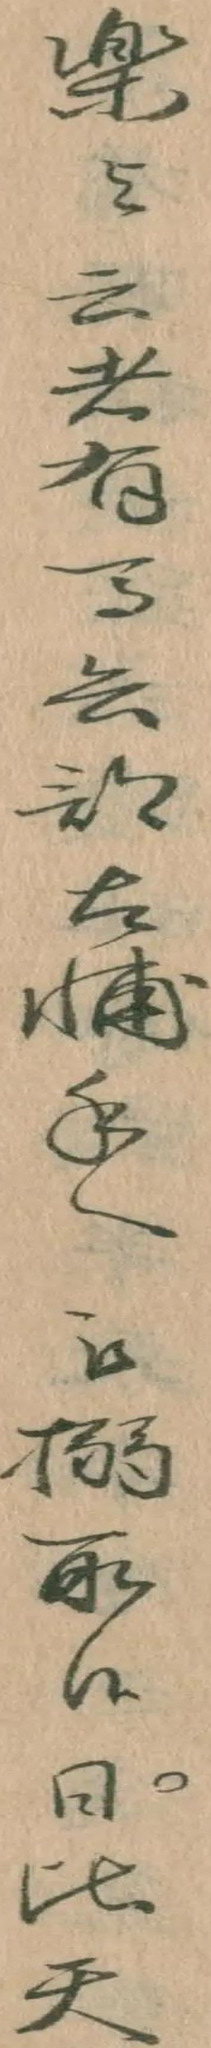楽与云者有馬兵部太輔手へ被搦取候日比天
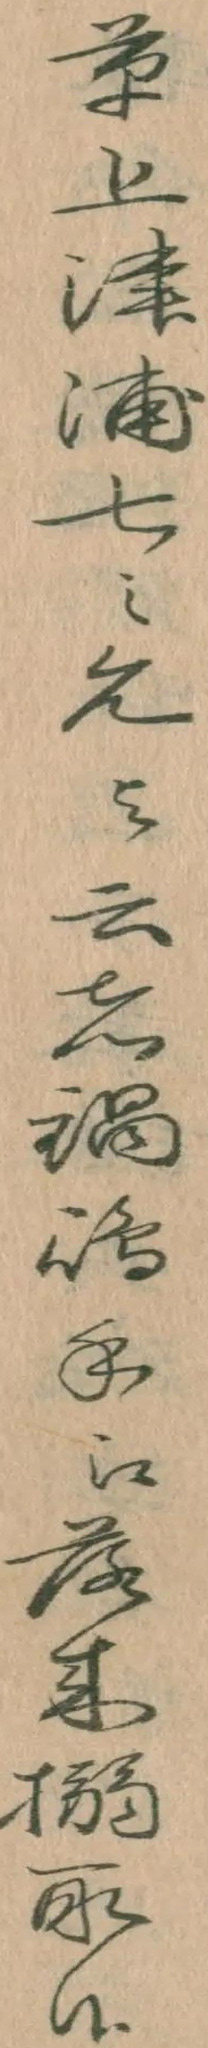草上津浦七之允与云者鍋島手江落来搦取候
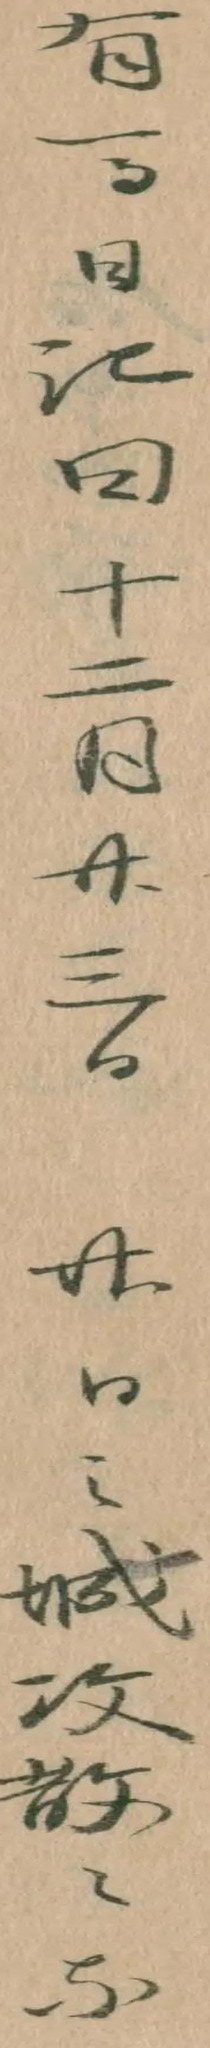有馬日記曰十二月廿三日廿口之城攻散々な
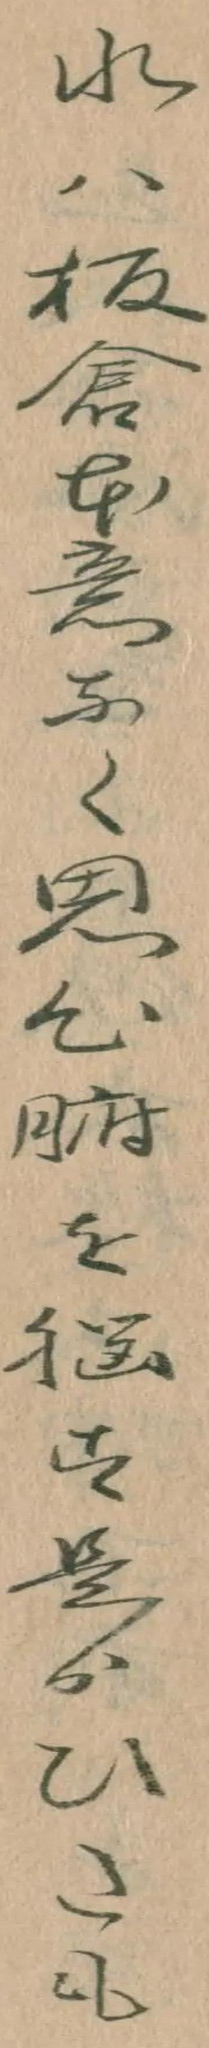れは板倉本意なく思心腑を脳春是ゟひこも
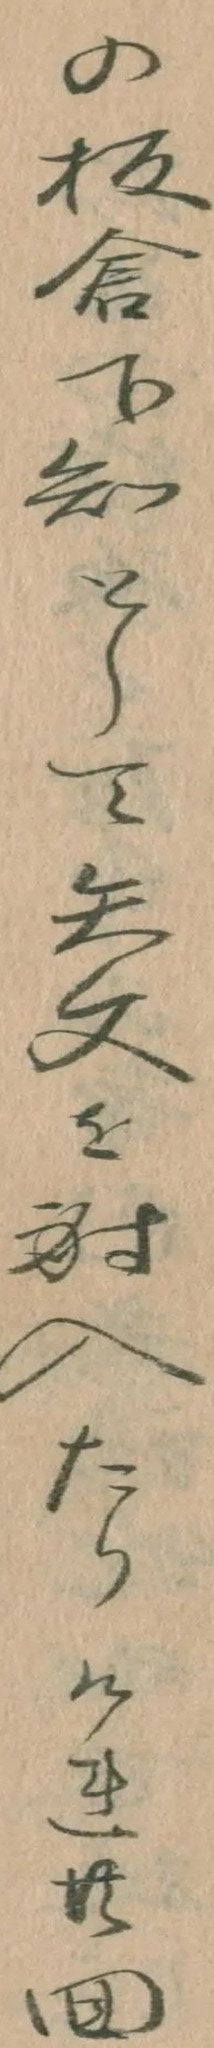の板倉下知として矢文を射入たりけ連共回
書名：切支丹御退治記 49巻. [4]
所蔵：国立国会図書館 National Diet Library, JAPAN
